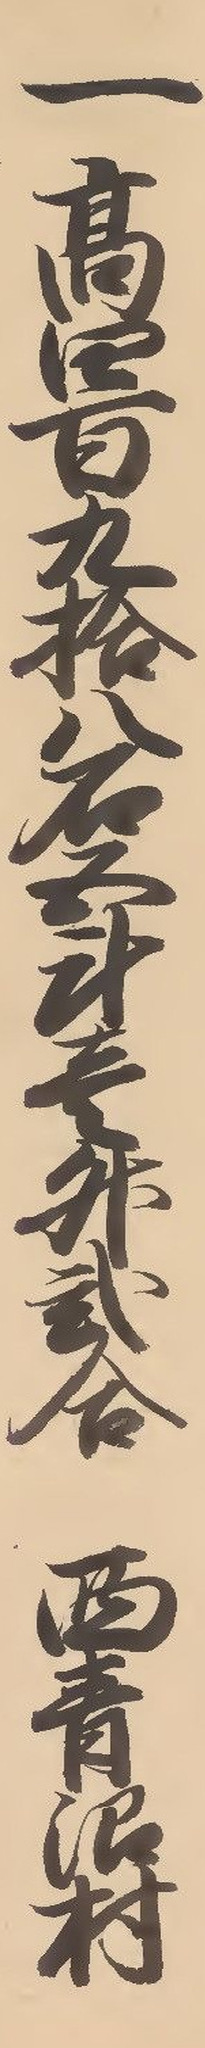一高四百九拾八石五斗壱升弐合西青沼村
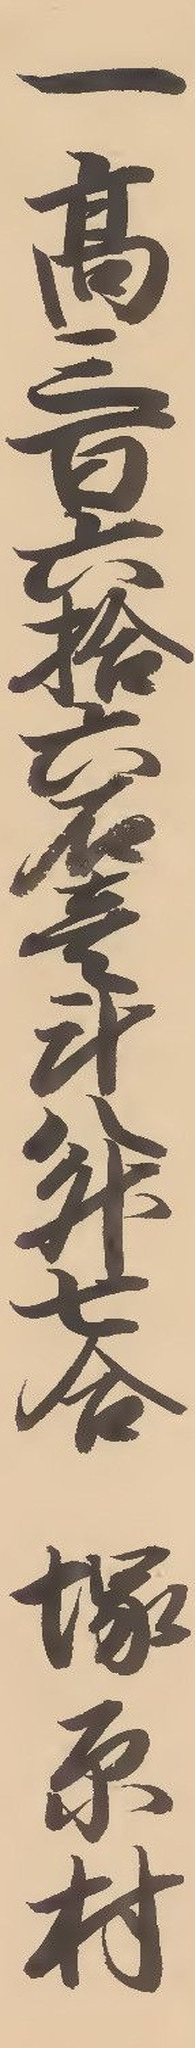一高三百六拾六石壱斗八升七合塚原村
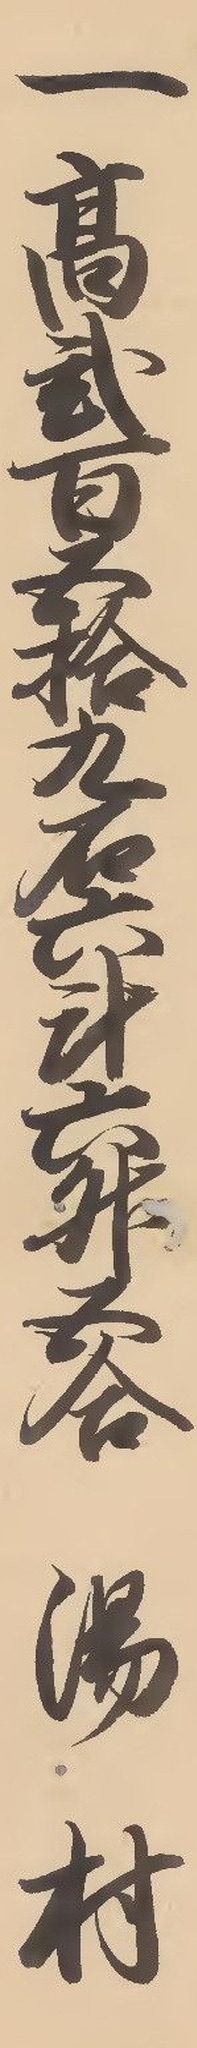一高弐百五拾九石六斗六升五合湯村

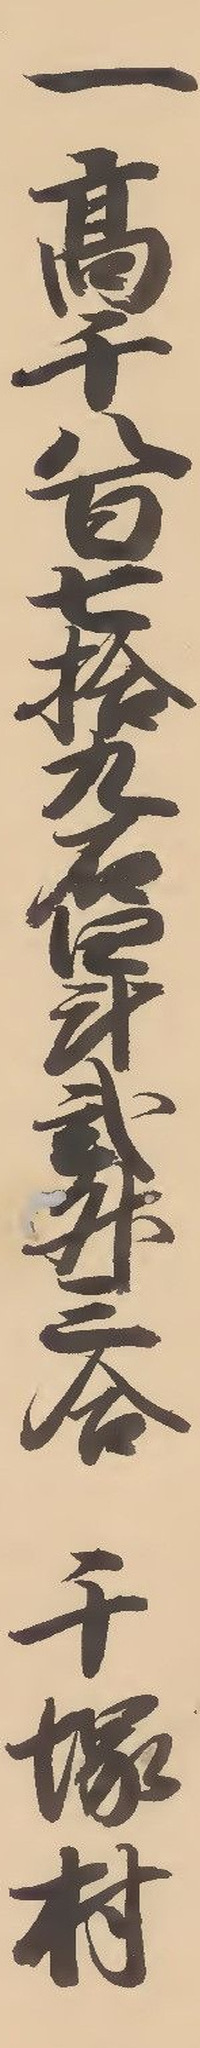一高千八百七拾九石四斗弐升三合千塚村
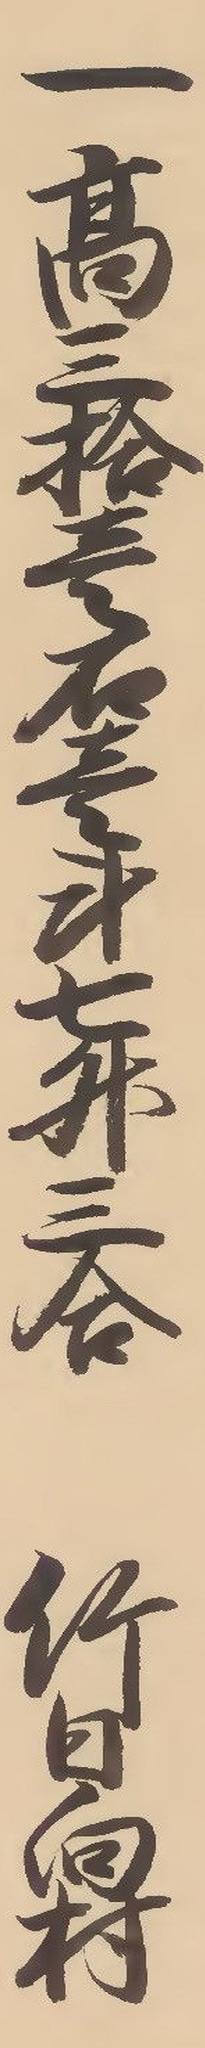一高三拾壱石壱斗七升三合竹日向村
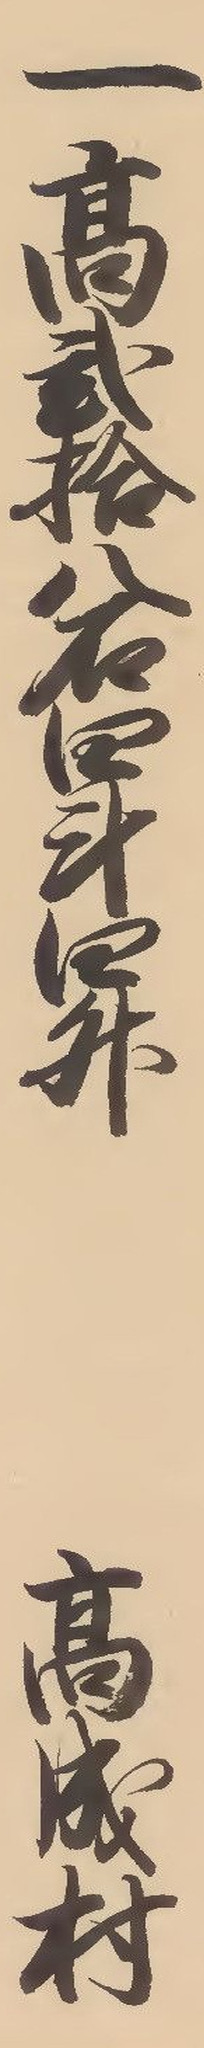一高弐拾八石四斗四升高成村
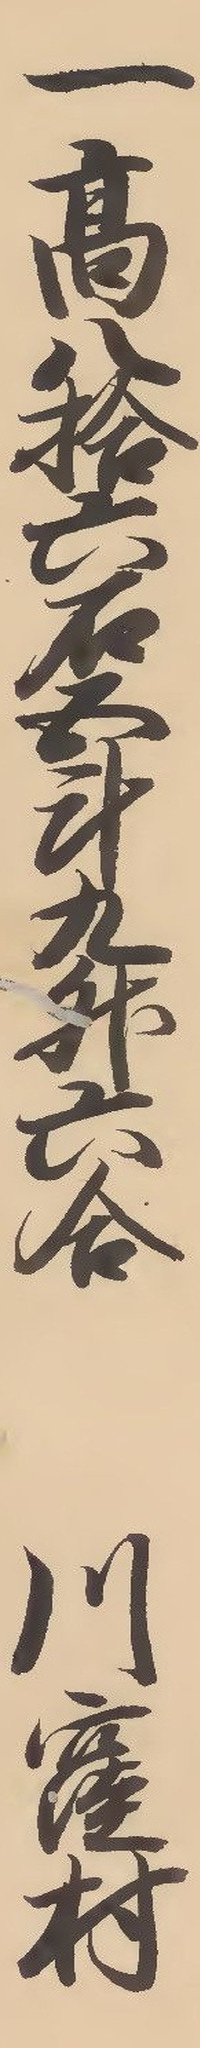一高八拾六石五斗九升六合川窪村
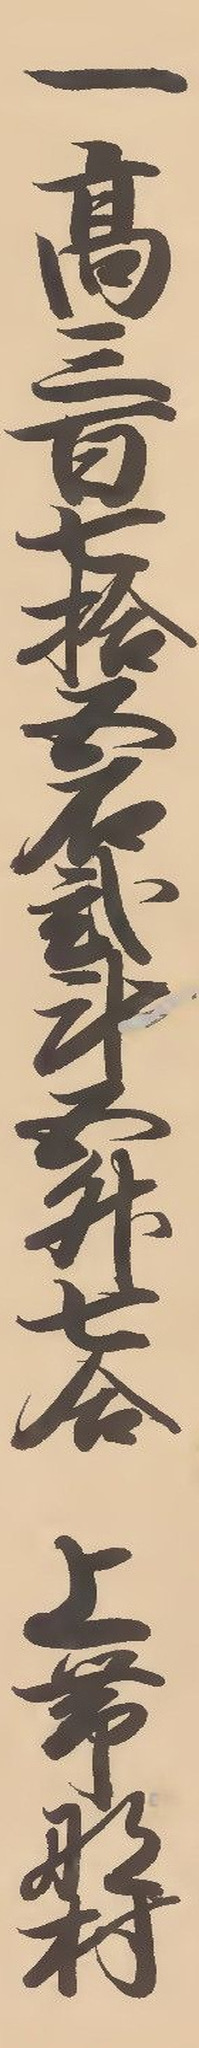一高三百七拾五石弐斗五升七合上帯那村
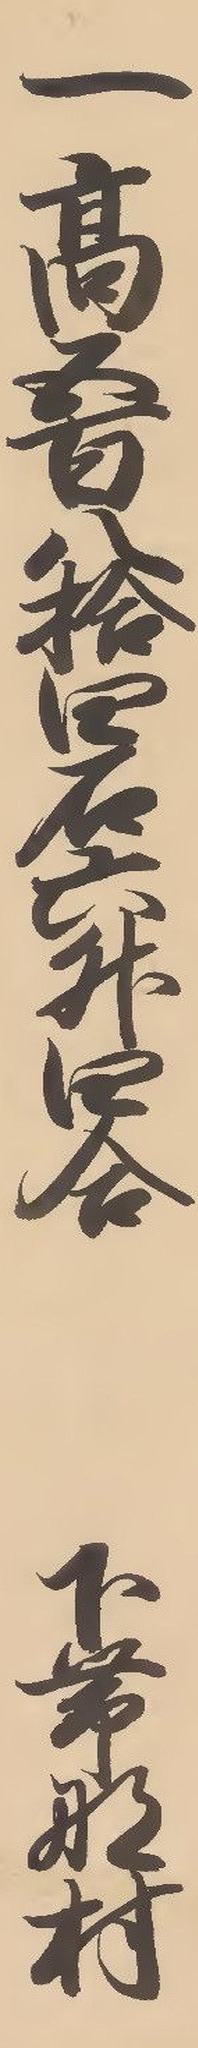一高五百八拾四石六升四合下帯那村
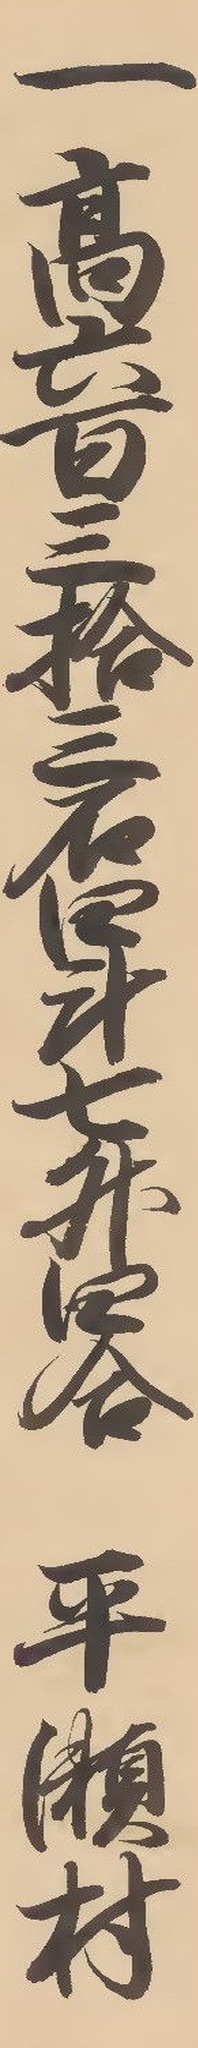一高六百三拾三石四斗七升四合平瀬村
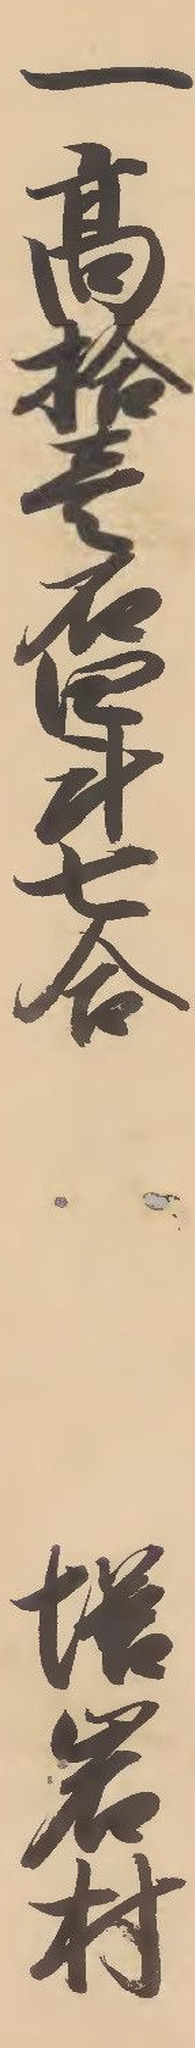一高拾壱石四斗七合塔岩村

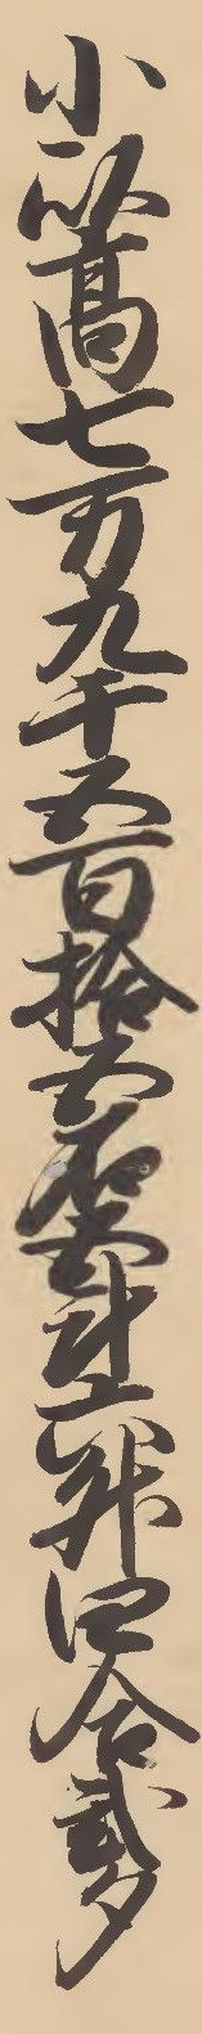小以高七万九千五百拾五石五斗六升四合弐勺
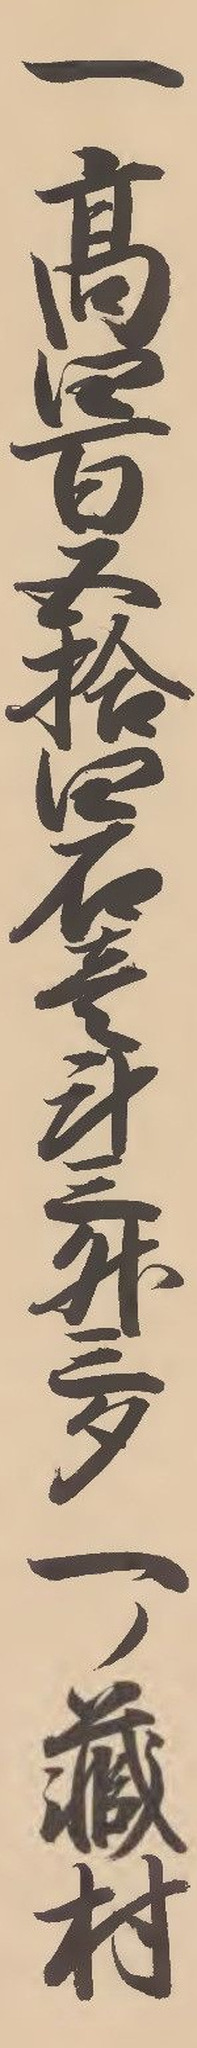一高四百五拾四石壱斗三升三勺一ノ蔵村
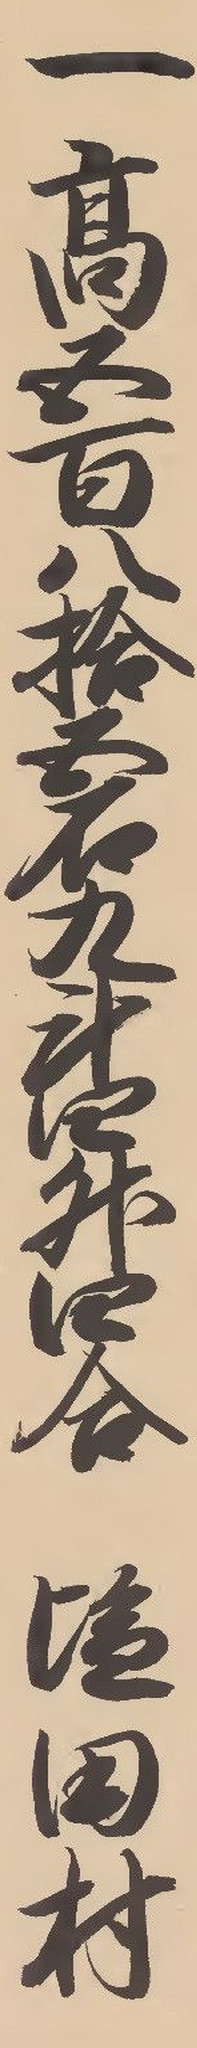一高五百八拾五石九斗四升四合塩田村
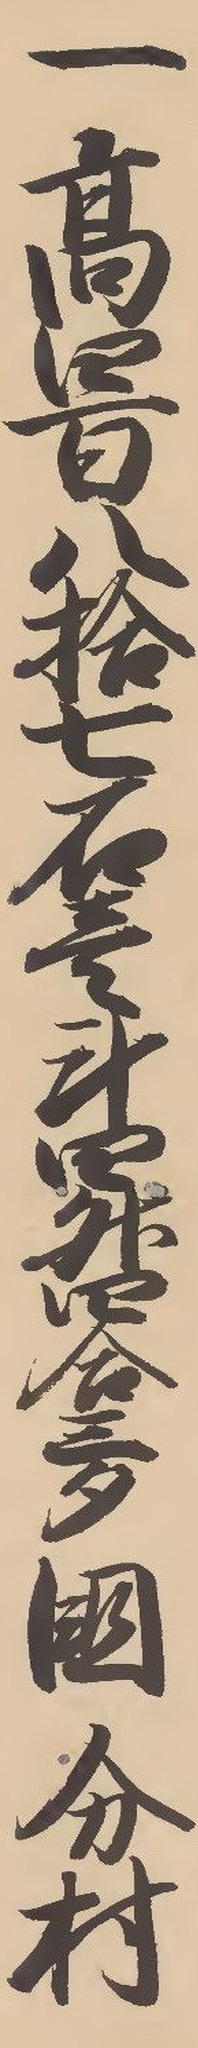一高四百八拾七石壱斗四升四合三勺国分村

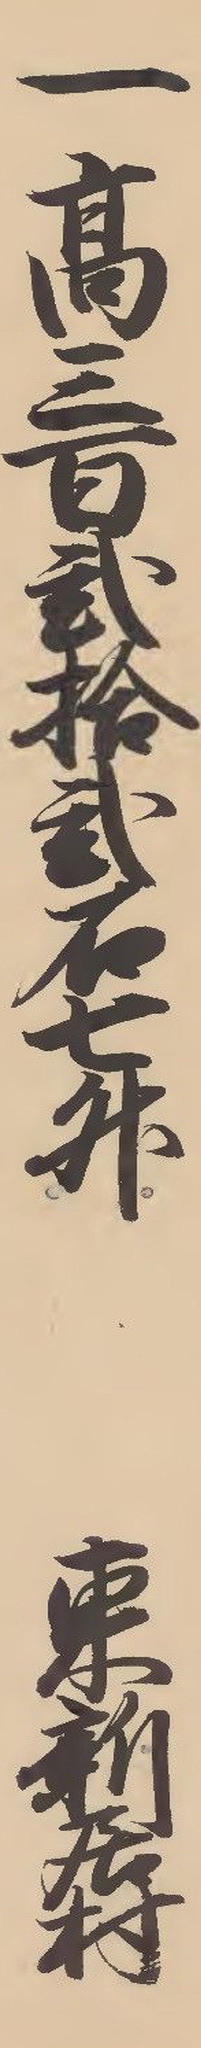一高三百弐拾弐石七升東新居村
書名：甲斐国郷帳
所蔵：国立公文書館 National Archives of Japan
